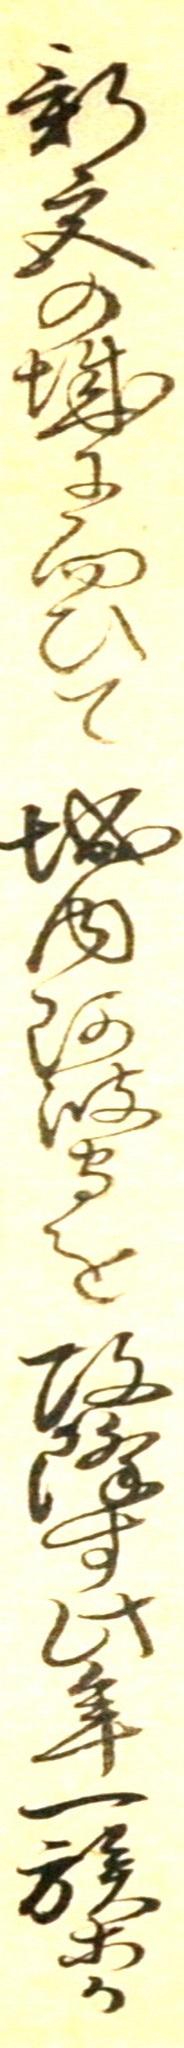新宮の城に向ひて城内阿波守を攻降す此年一族等か
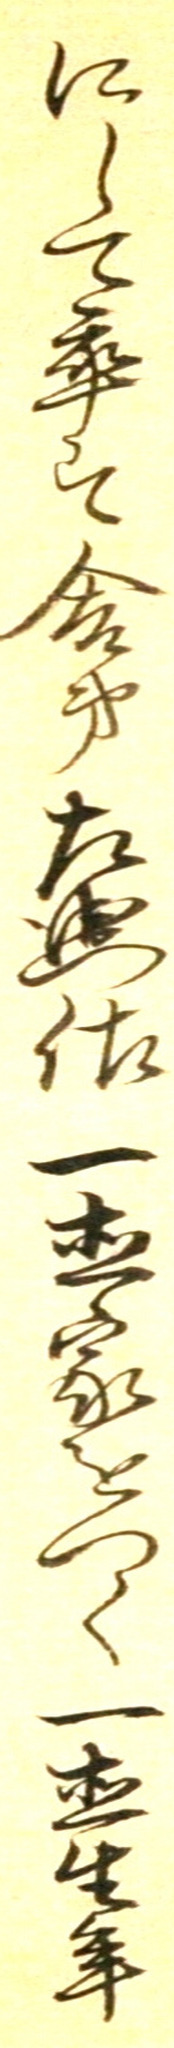にして卒す舎弟左衛門佐一直家をつく一直生年
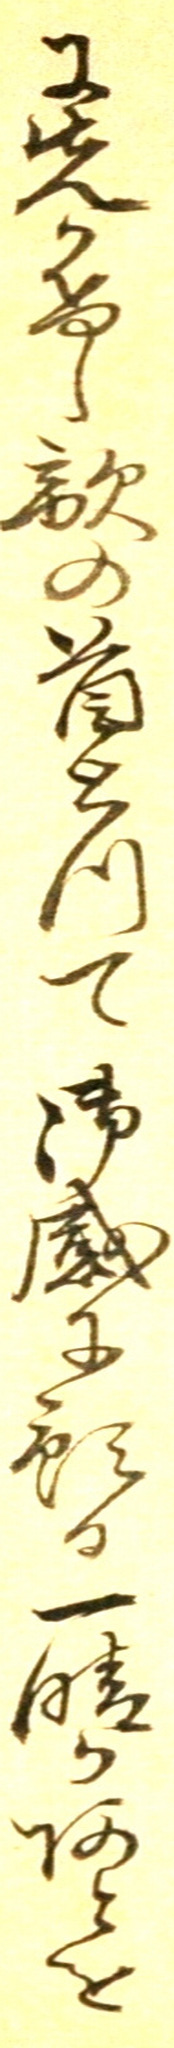に先かけし敵の首とつて御感に預る一晴かあとを
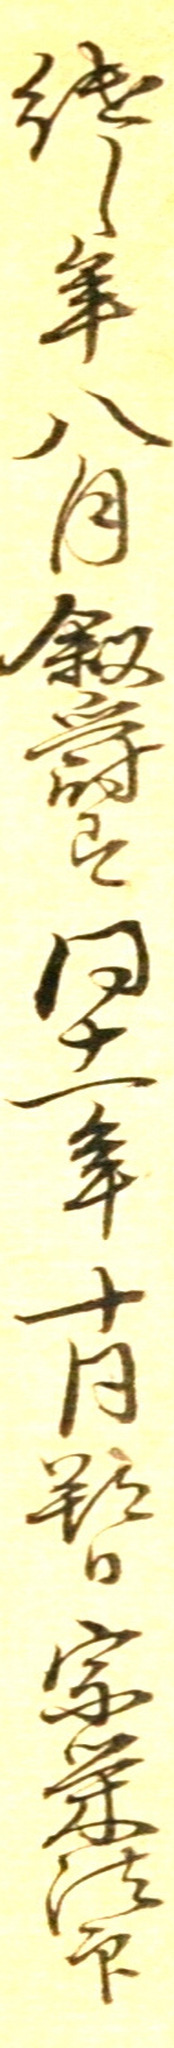継し年八月叙爵す同十一年十月朔日宗栄法印

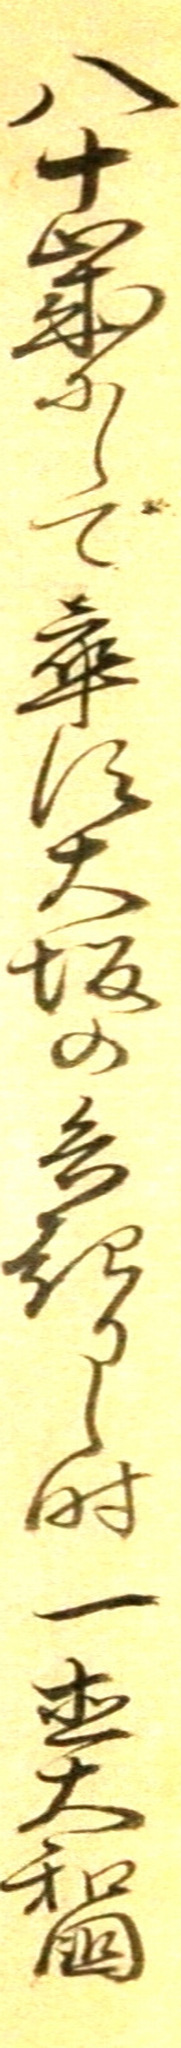八十歳にして卒す大坂の兵起りし時一直大和国
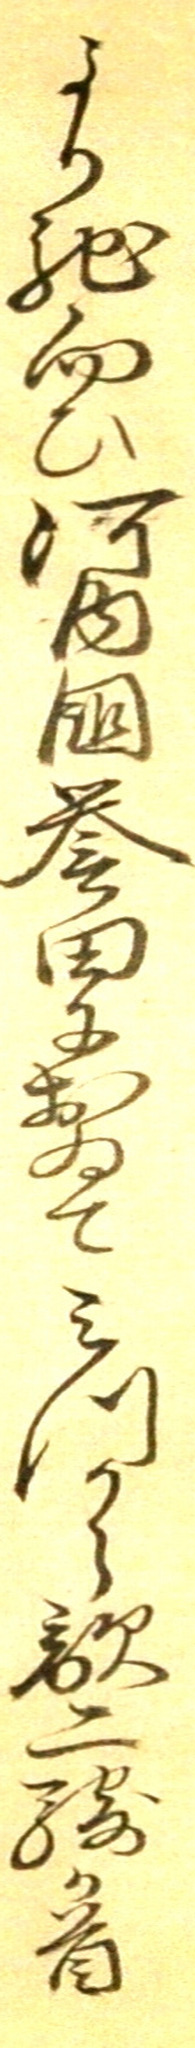より馳向ひ河内国誉田におゐてみつから敵二騎か首
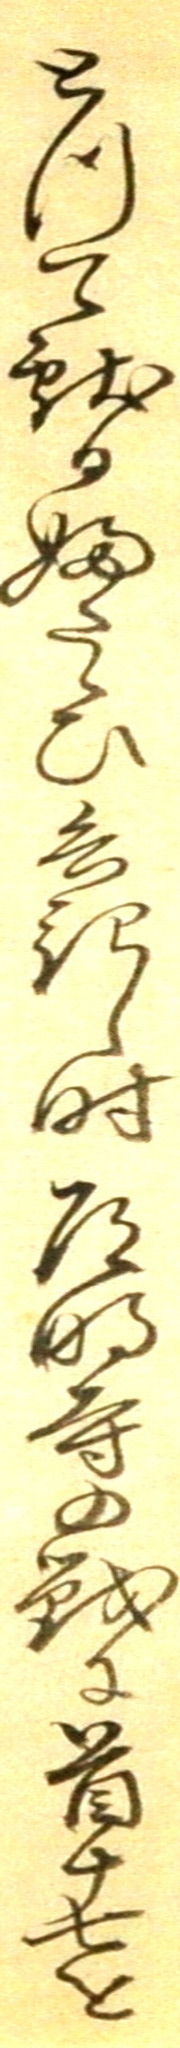とつて献るふたゝひ兵起し時道明寺の戦に首十七を
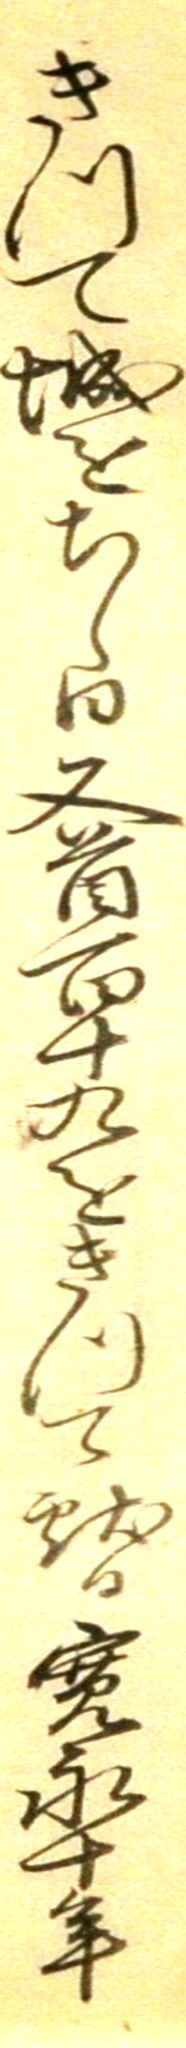きつて城をちし日又首百十九をきつて献る寛永十年
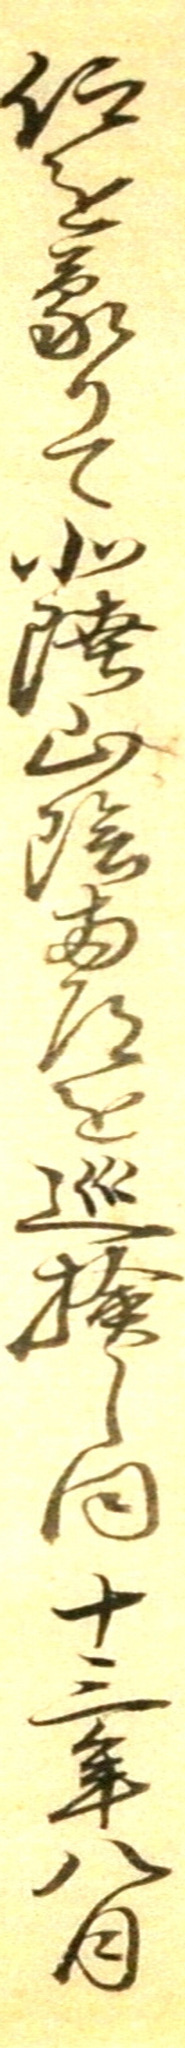仰を蒙りて北陸山陰両道を巡検し同十三年八月
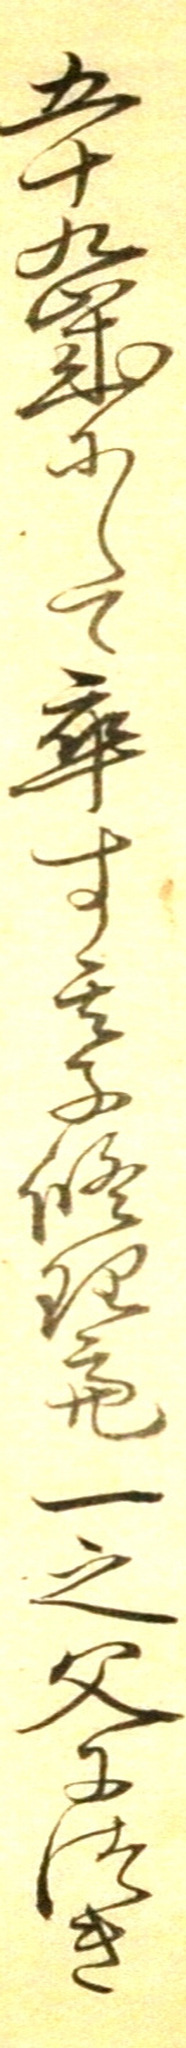五十九歳にして卒す其子修理亮一之父につき
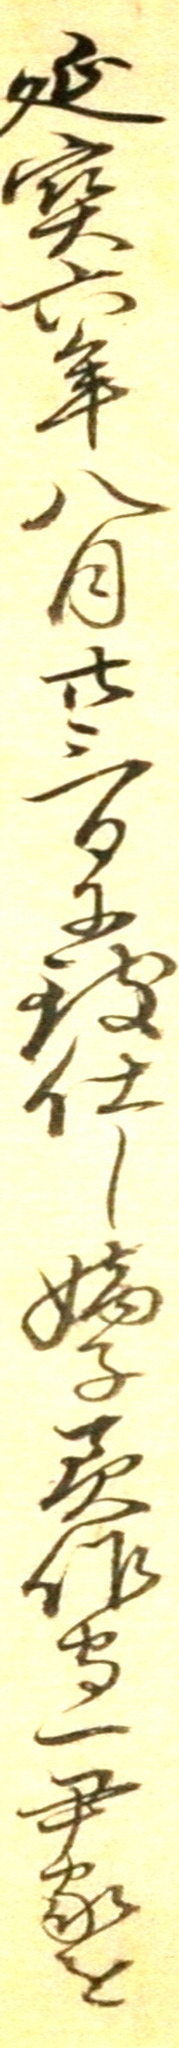延宝六年八月廿三日に致仕し嫡子美作守一尹家を
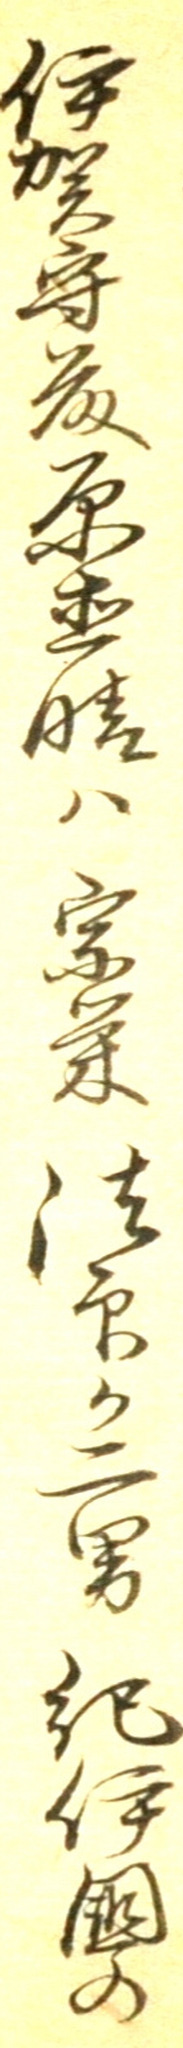伊賀守藤原直晴は宗栄法印か二男紀伊国の
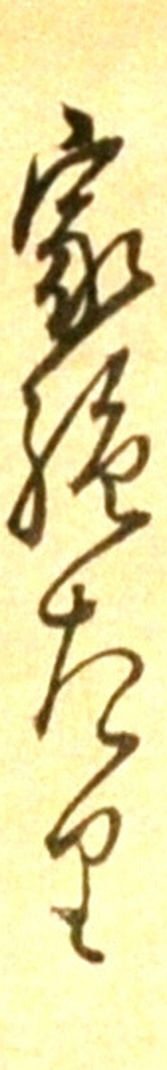家絶たり

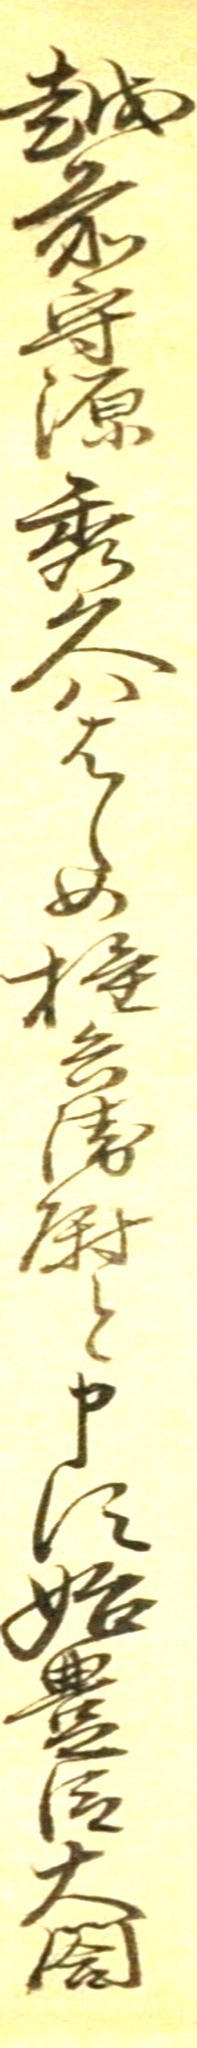越前守源秀久ははしめ権兵衛尉と申す始豊臣太閤
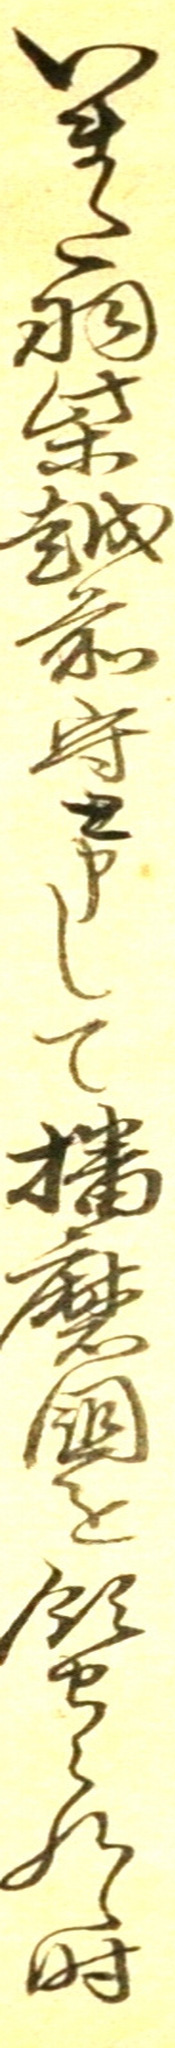いまた羽柴越前守と申して播磨国を領せられし時
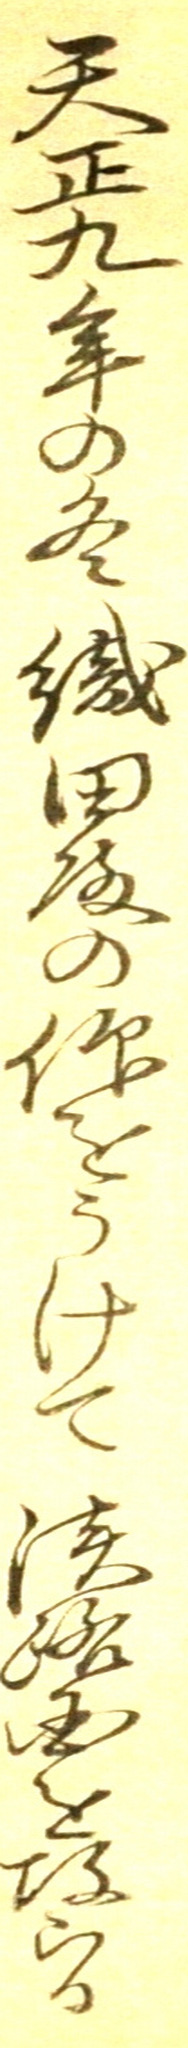天正九年の冬織田殿の仰をうけて淡路国を攻らる
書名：藩翰譜（九・上）
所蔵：伊那市立高遠町図書館・合同会社AMANE
